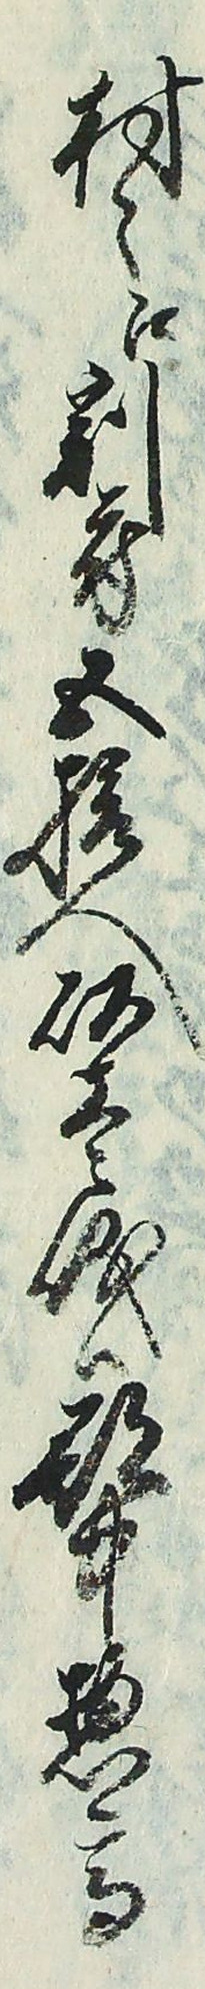村々え割符五十人以上之儀は郡中惣高
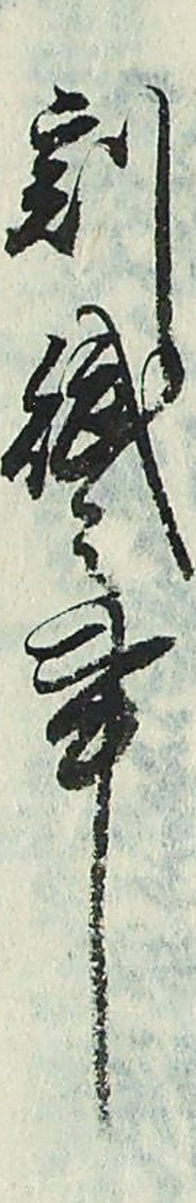割賦之事
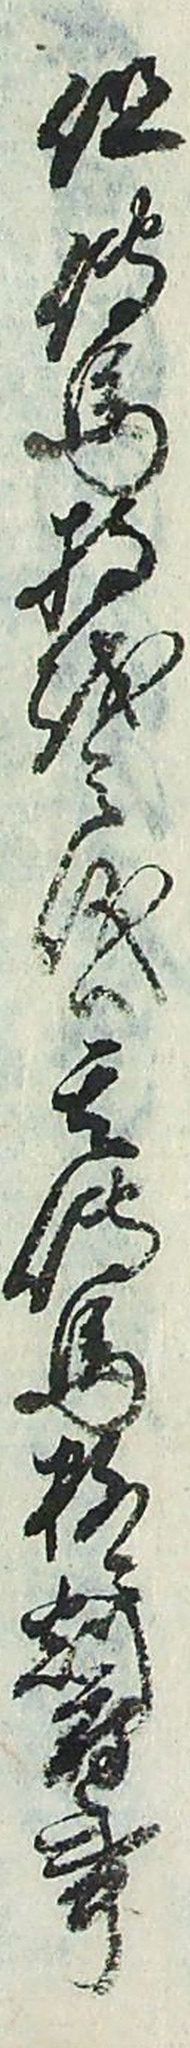但伝馬持残之儀は其伝馬数に割符之事
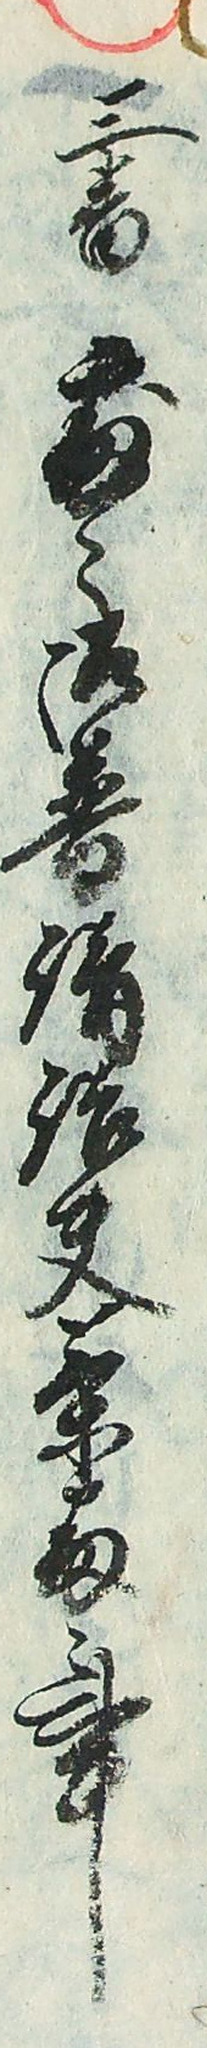三番処々御普請詰夫茶番之事

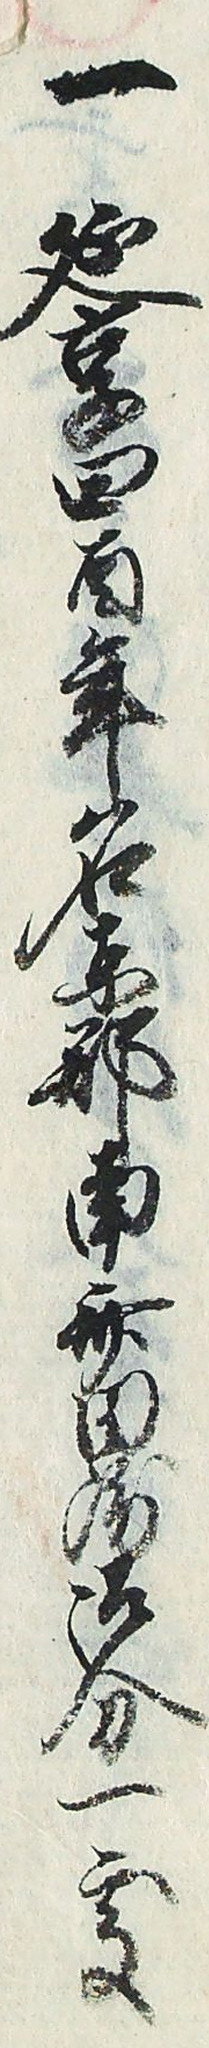一延享四酉年名東郡南斎田浦御分一処
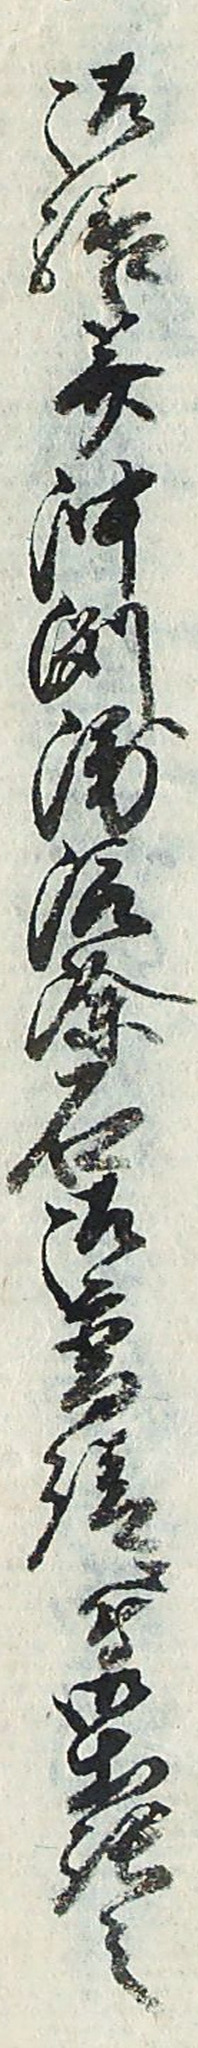御繕幷沖洲浦浪除石御普請に付御出張之
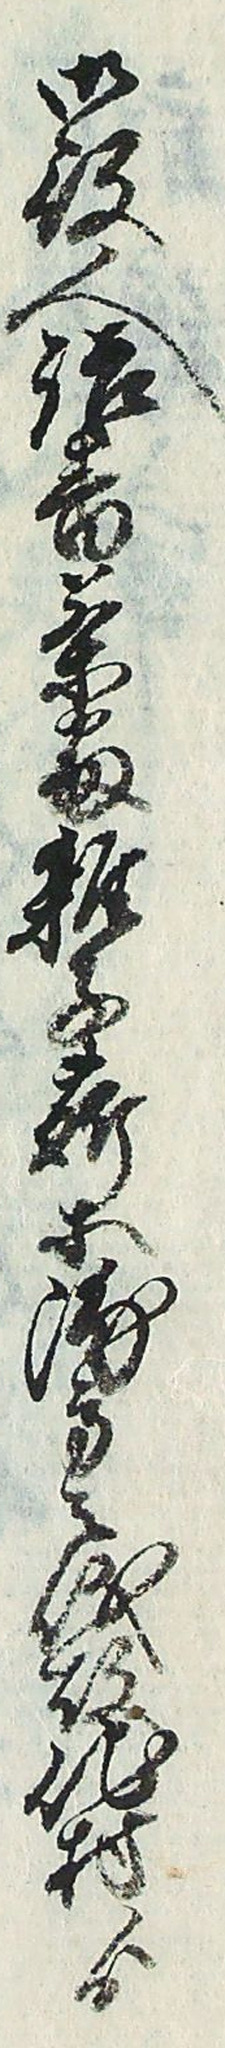御役人詰番茶番雑子薪等浦方之儀故他村より
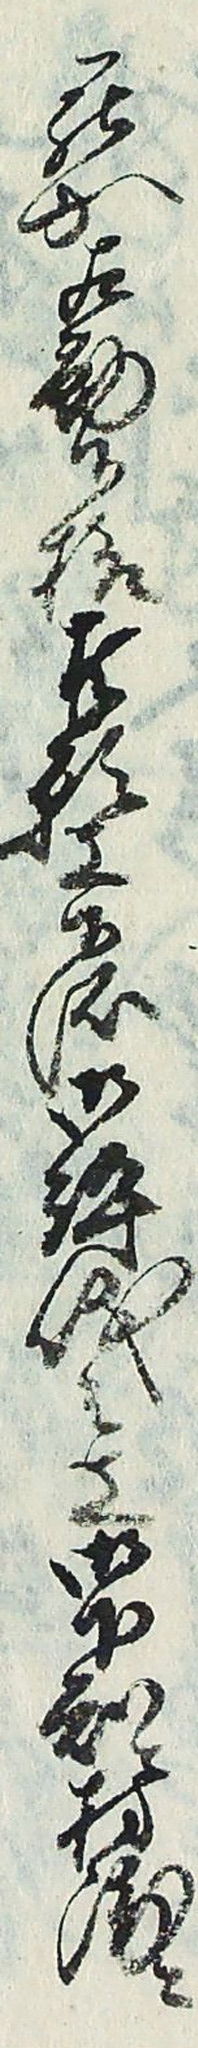罷出相勤候様奉願上候所御評儀之上御下知に村浦に
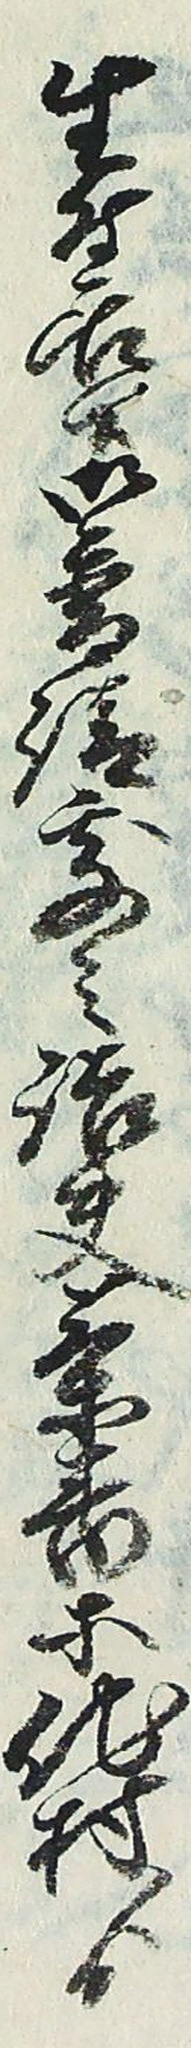生付居候御普請処之詰夫茶番等他村より
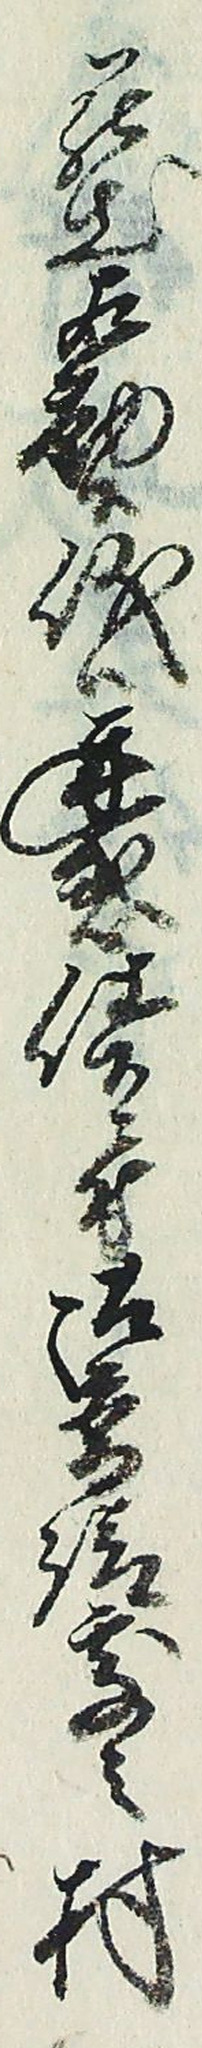罷出相勤候儀は迷惑仕候に付御普請処の村
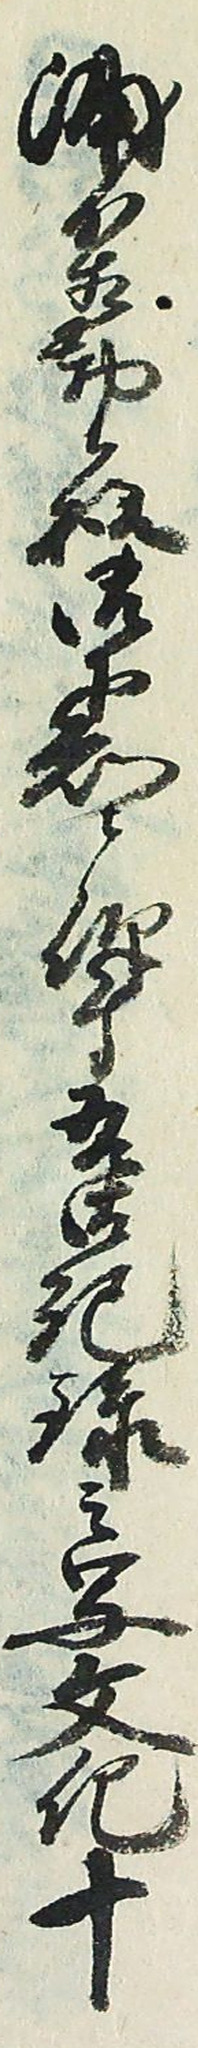浦より相勤候様御下知被仰付右御記録之写文化十
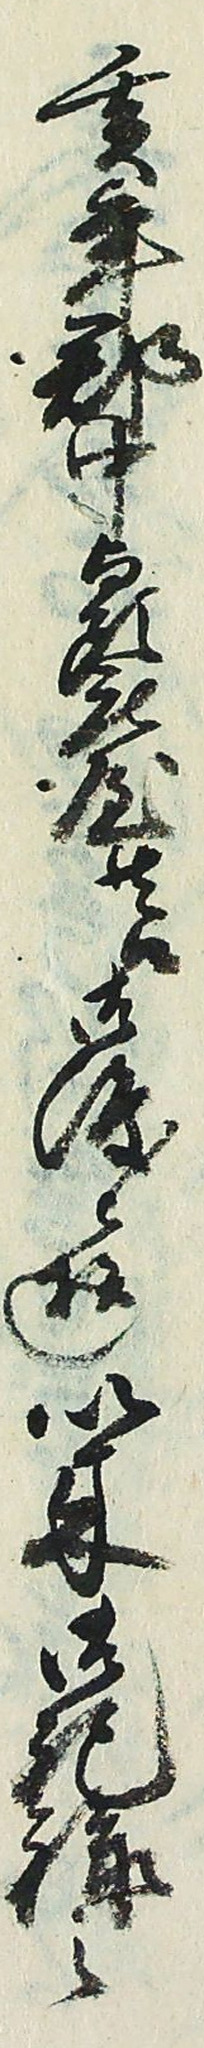亥年郡中与頭庄屋共え御渡被遊以来御記録之
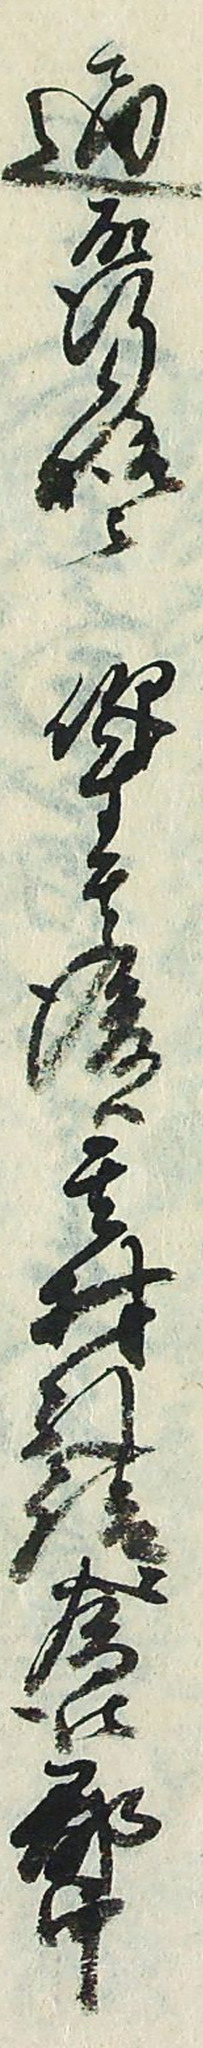通取行候様被仰付其後は其村引請に為仕郡中
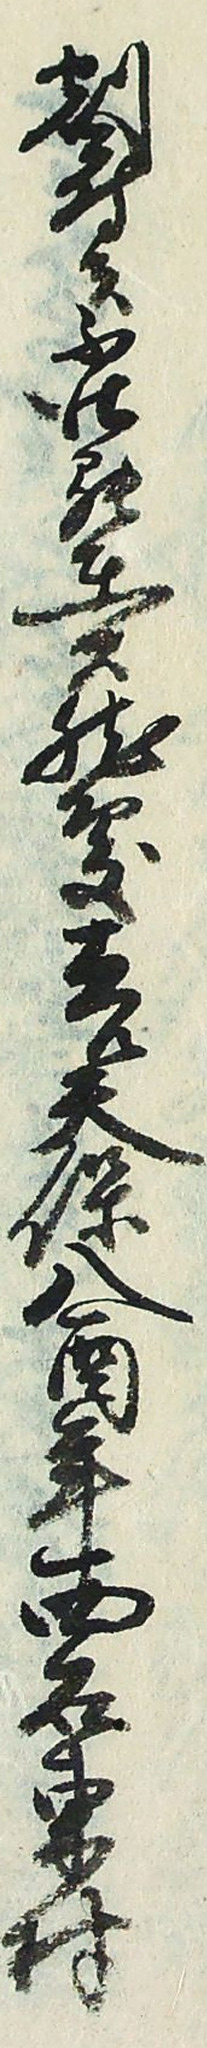割符は不仕罷在候然処去る天保八酉年西名東村
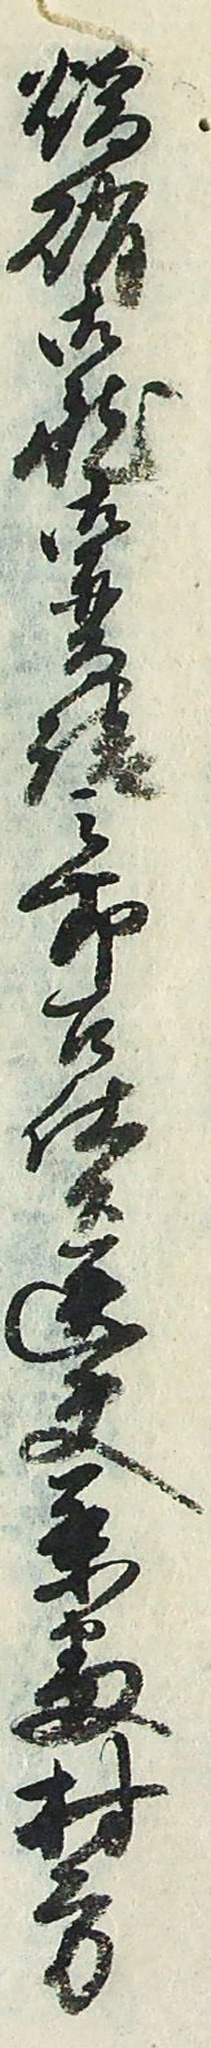焰硝御蔵御普請之節召仕候送夫茶番村方
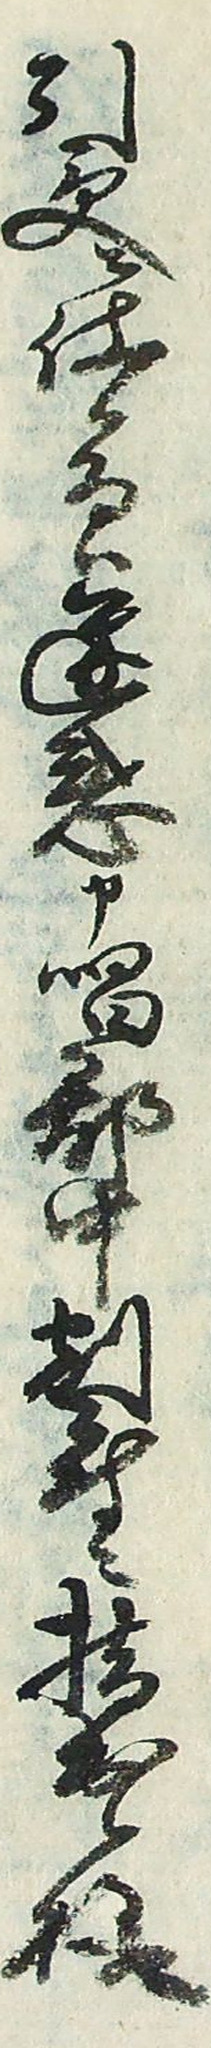引受に仕候而は迷惑申唱郡中割符に指出候様
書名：諸割賦物賃銀定記録帳
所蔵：鳴門教育大学 Naruto University of Education
